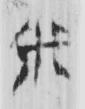米
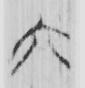六
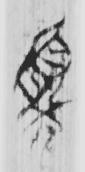{肉犬頁}
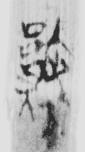敗
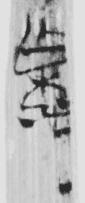渫
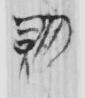則
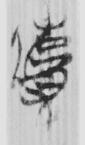{人𡴎貝}
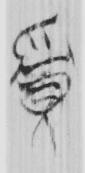{爪冖貝}
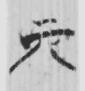亓
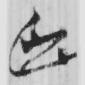臣
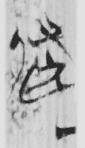{付臣}
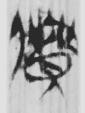{人舛亼貝}
